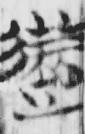速
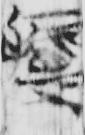○（瘥）
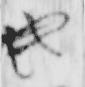母
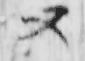又（有）
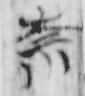柰
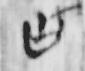占
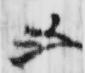之
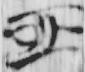亙
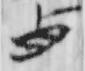貞
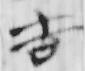吉
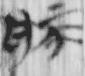疾
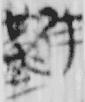○（難）
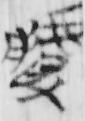○（瘥）
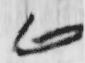㠯
